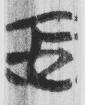𠁩
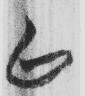㠯（以）
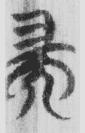耑
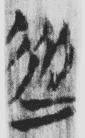從
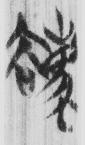{去廌}
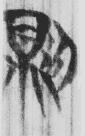則
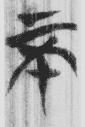不
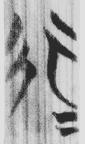行=
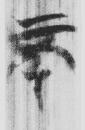不
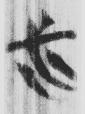必
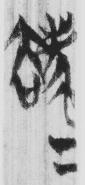{去廌}
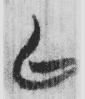㠯（以）
